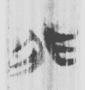非
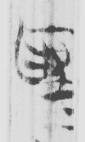聖=
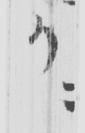人=
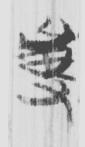尃
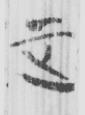正
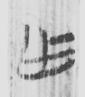戶
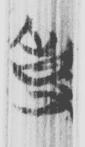事
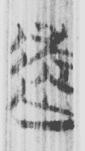遠
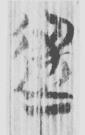逐
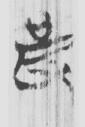皮
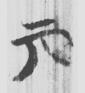亓
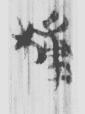{木甫}
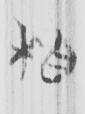相
